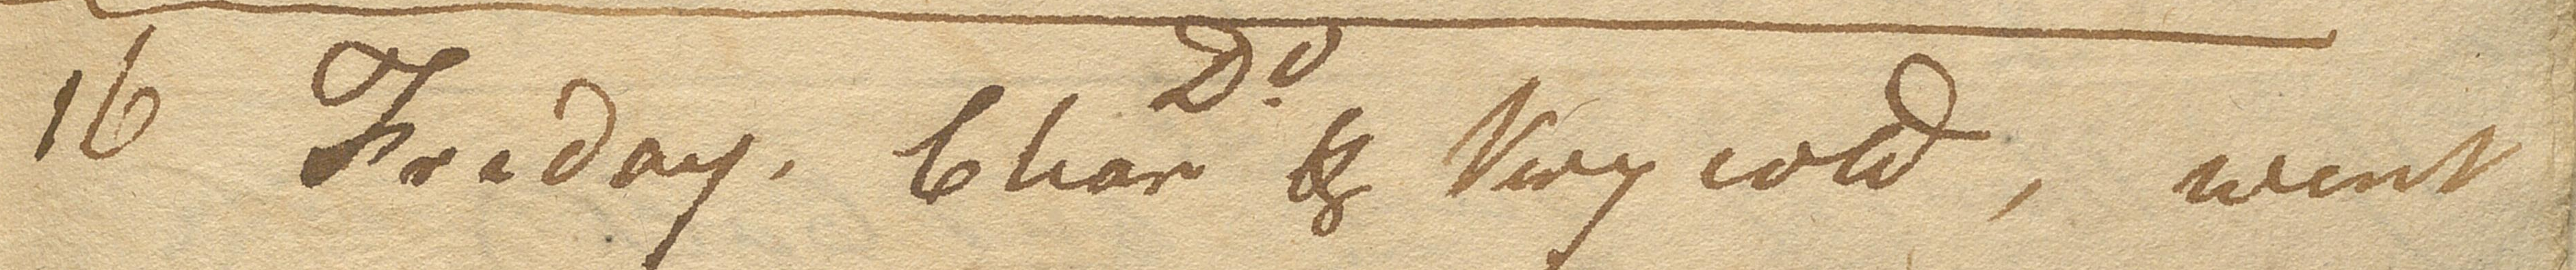16 Friday. Clear & Very cold, went
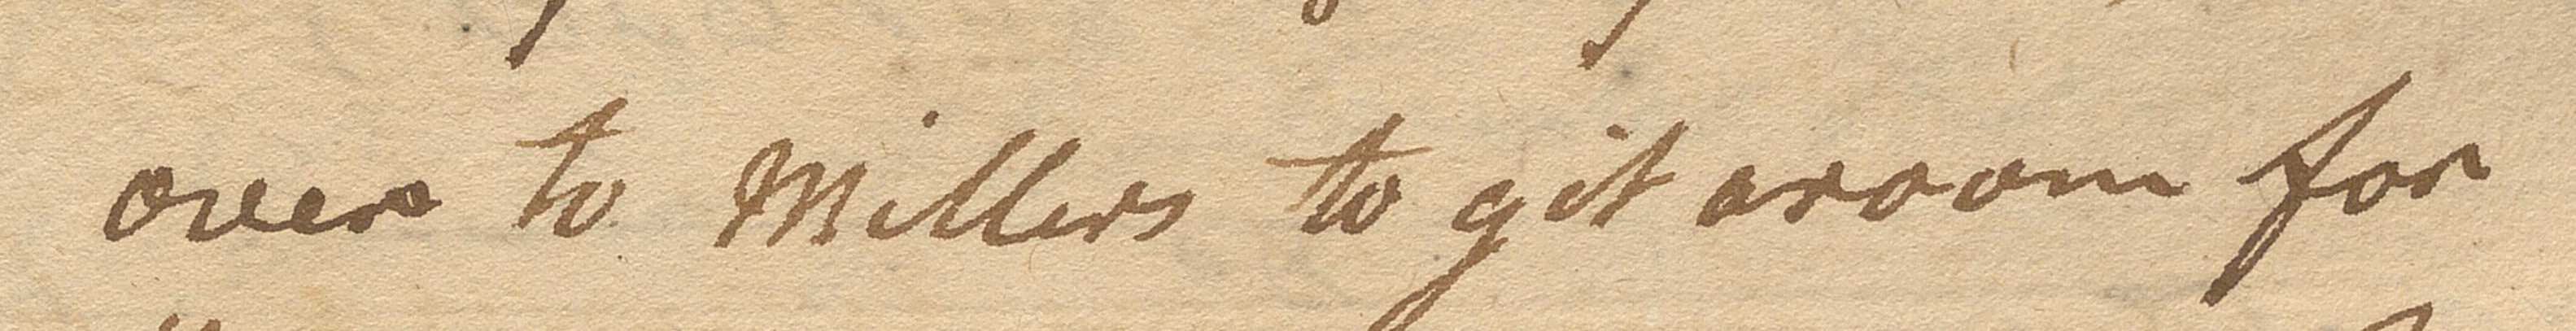over to Millers to get a room for
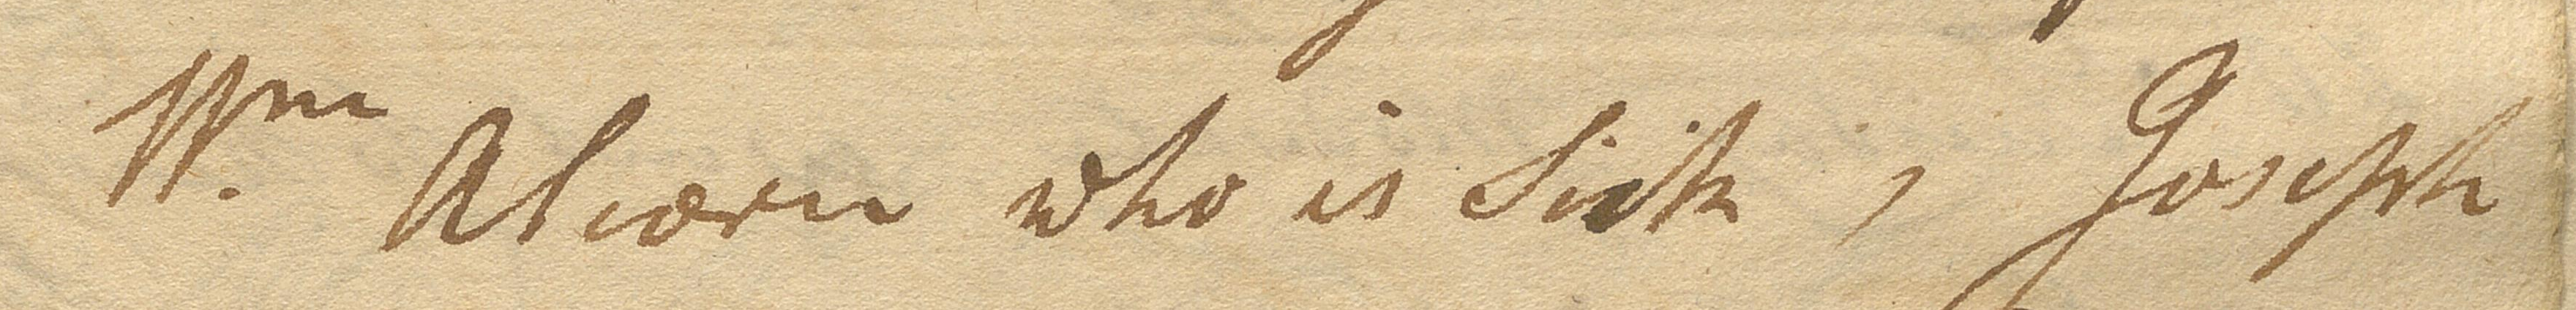W^m. Alcorn who is Sick, Joseph
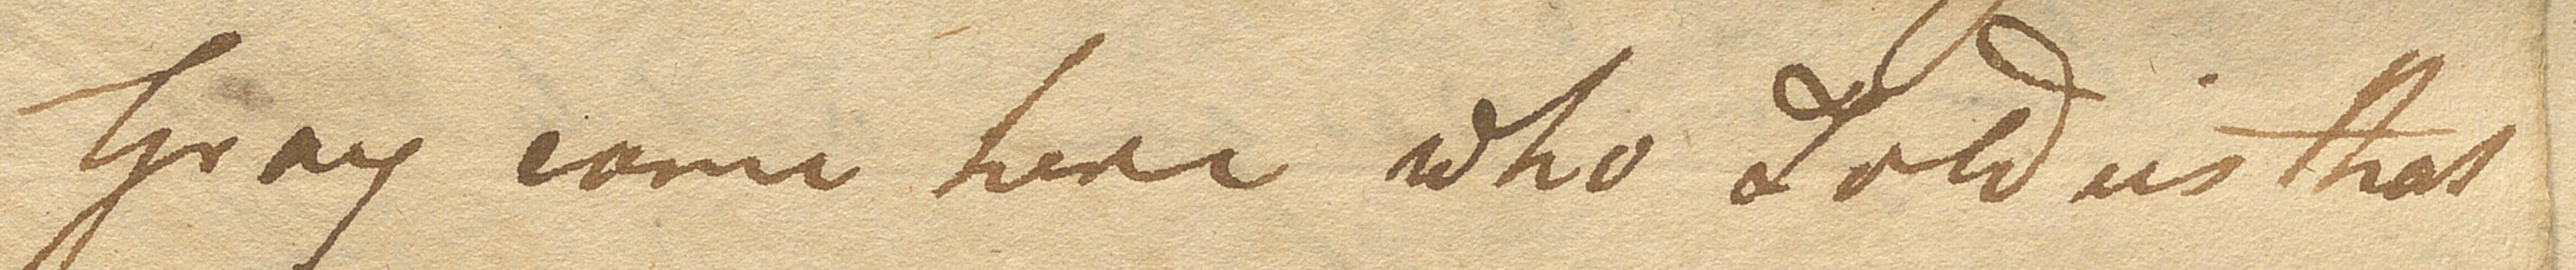Gray came here who Told us that
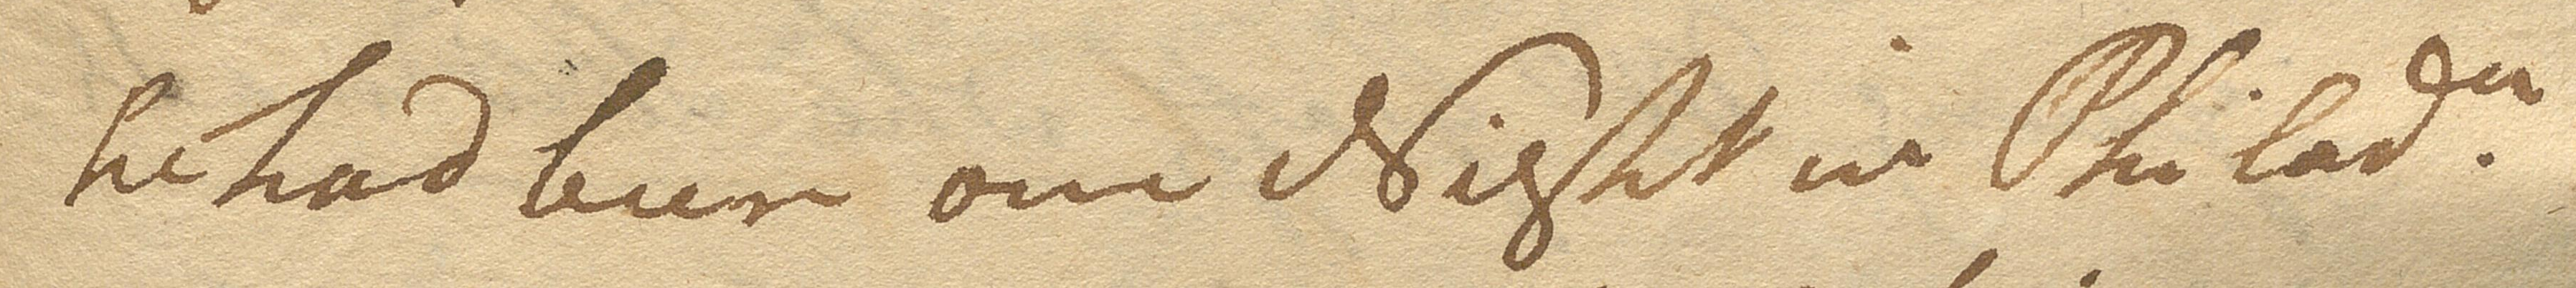he had been our Night in Philad^a.
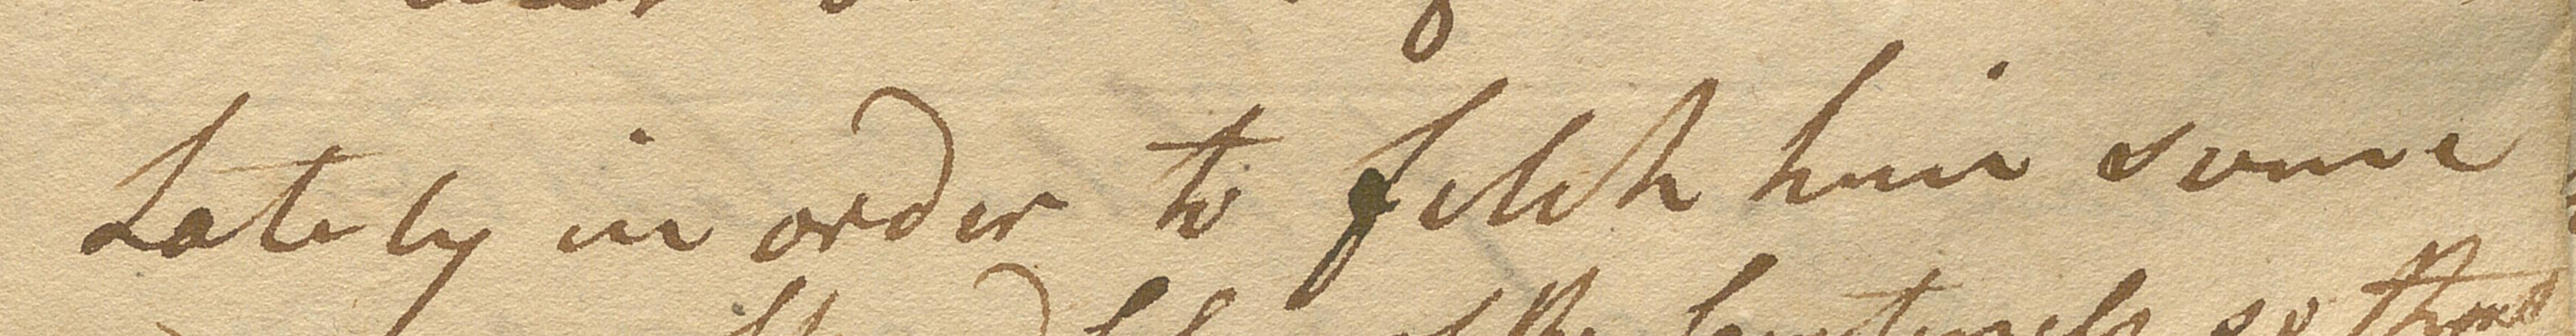Lately in order to fetch him some
